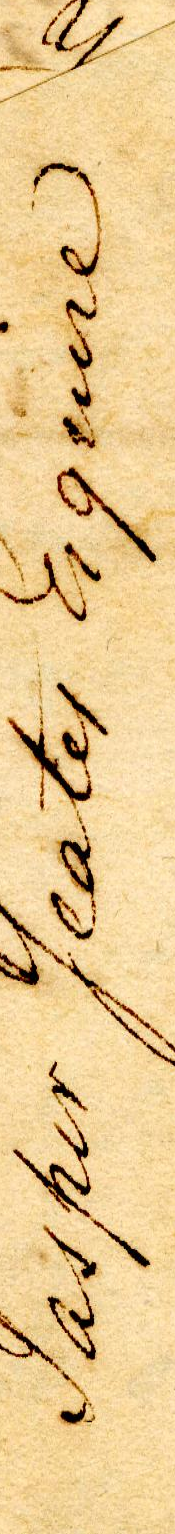Jasper Yeates Esquire
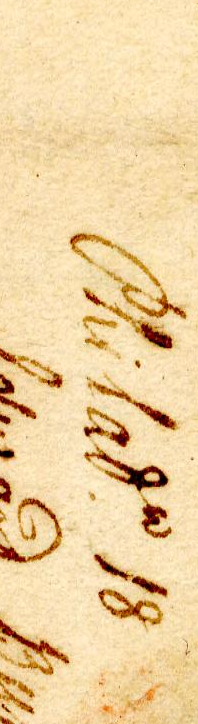Philad^a. 18
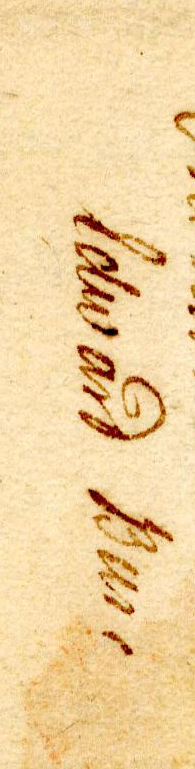Edward Burd
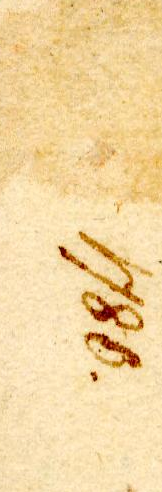1780
